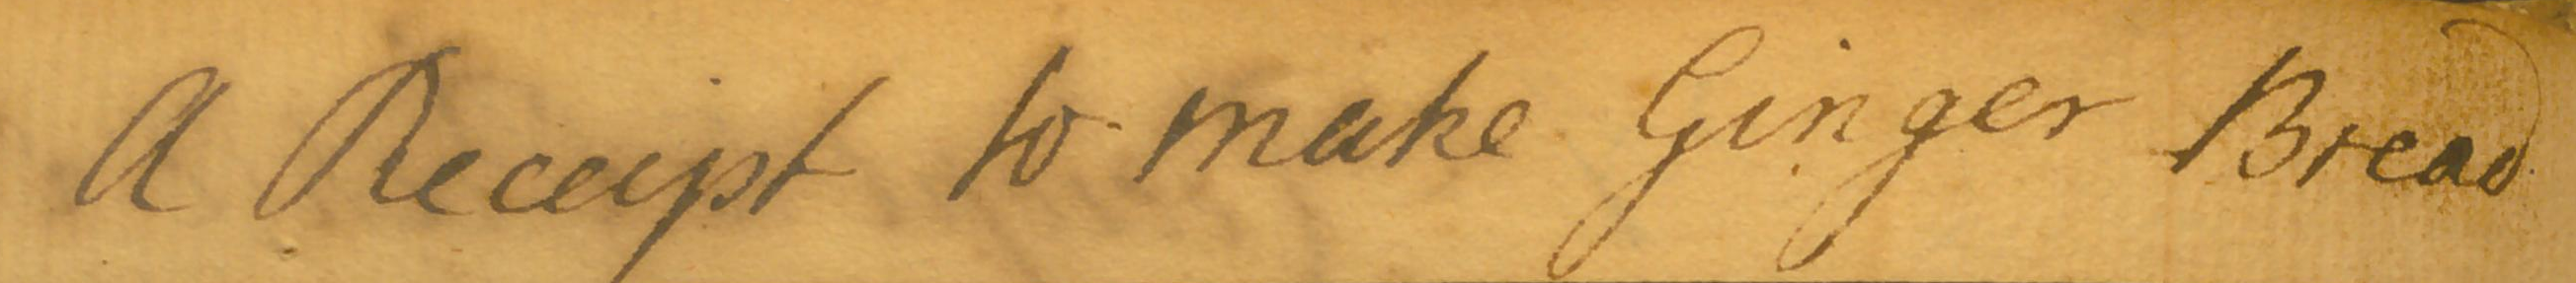A Receipt to make Ginger Bread
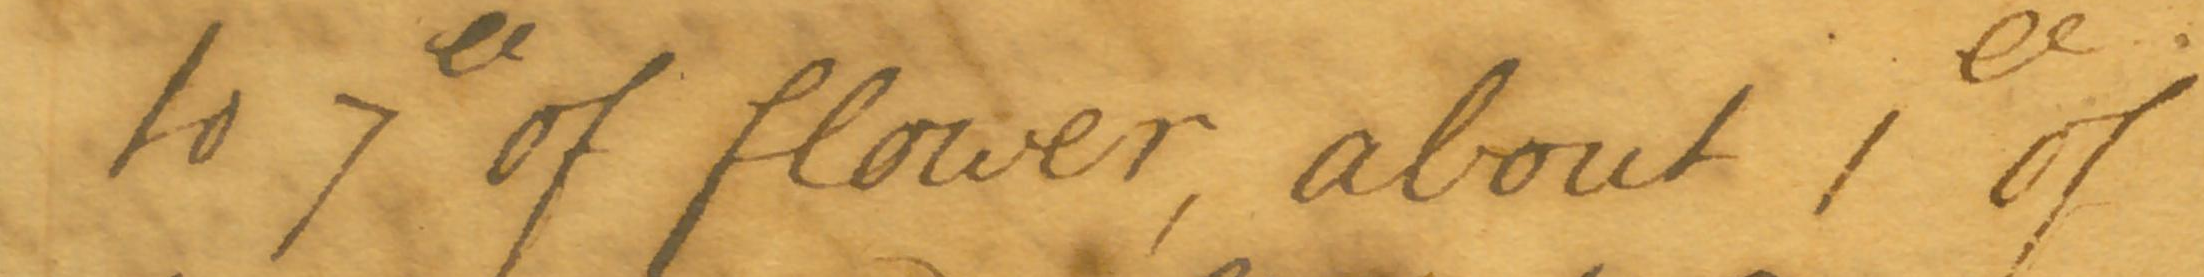to 7 ^lb of flower about 1 ^lb of
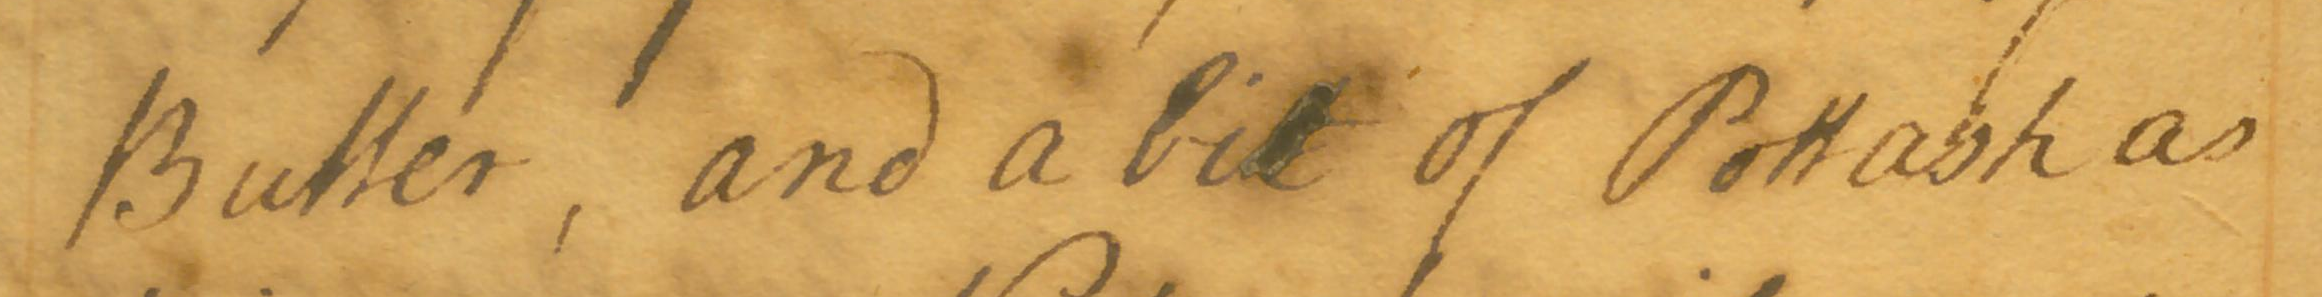Butter, and a bit of Pottash as
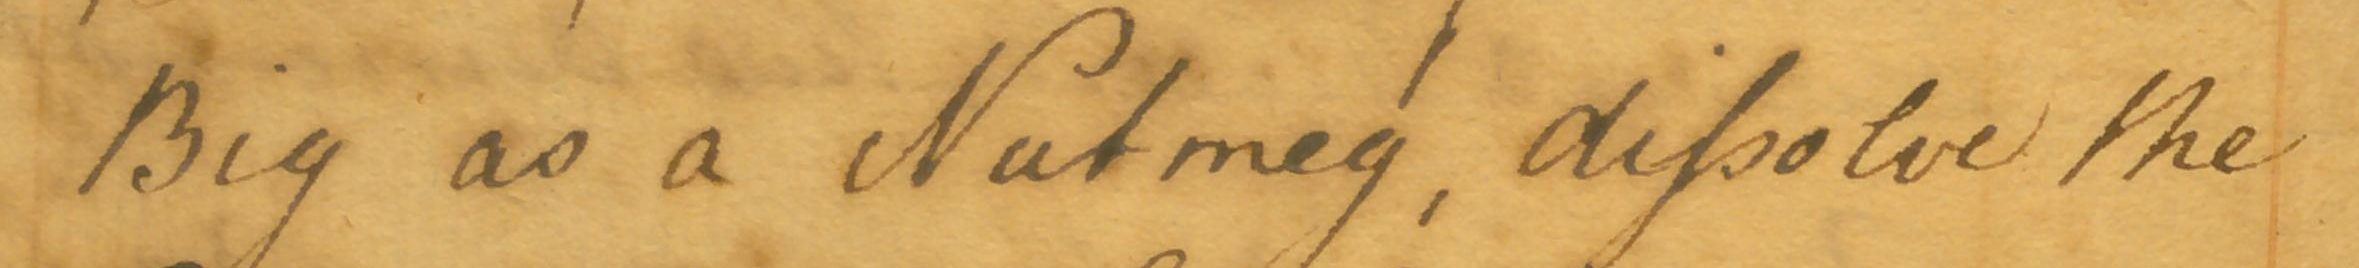Big as a Nutmeg, dissolve the
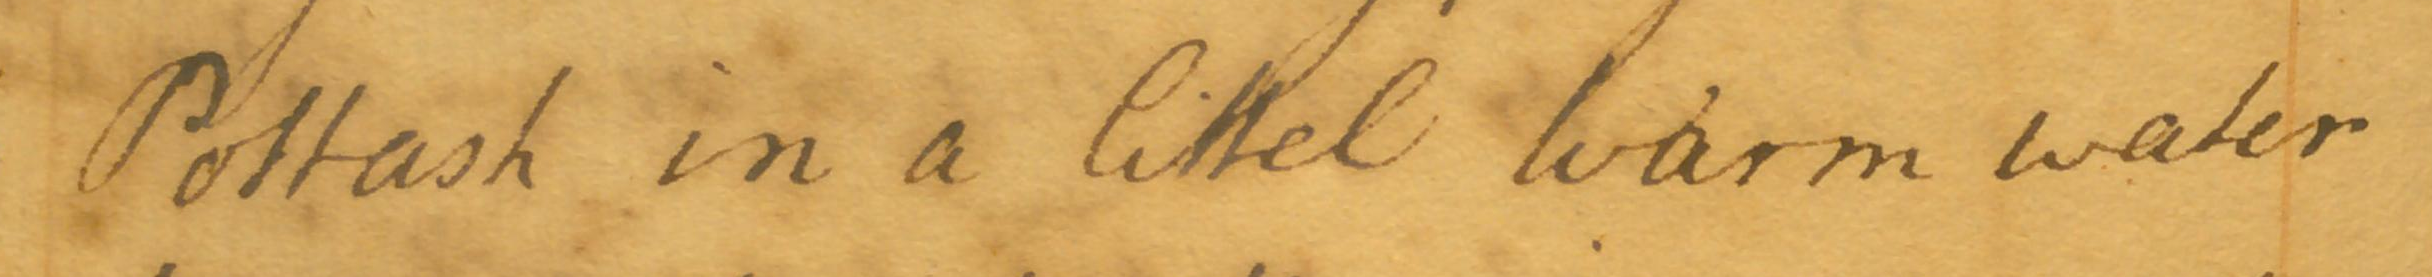Pottash in a littel warm water
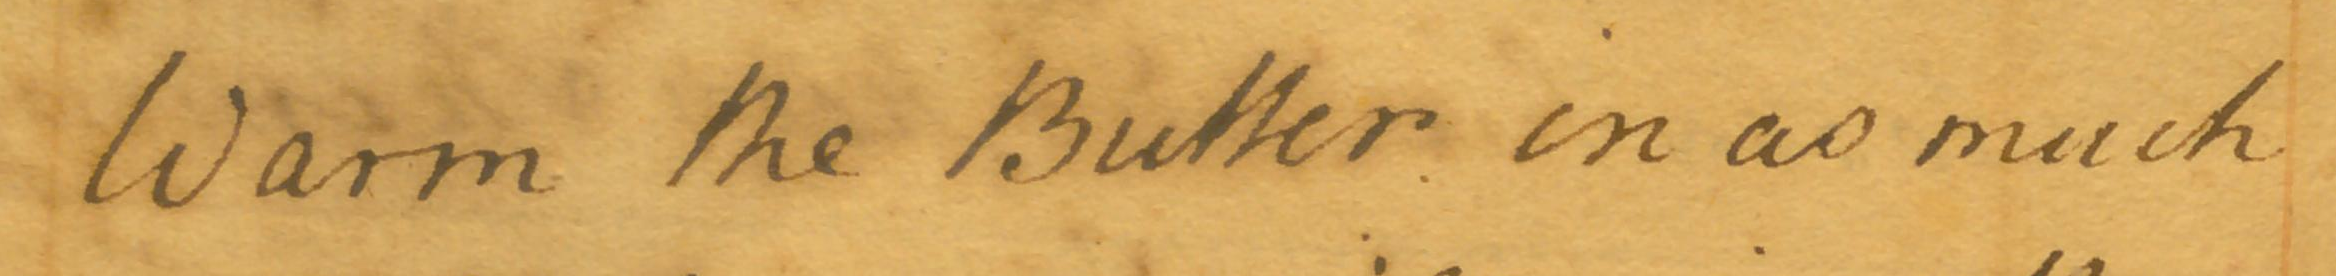Warm the Butter in as much
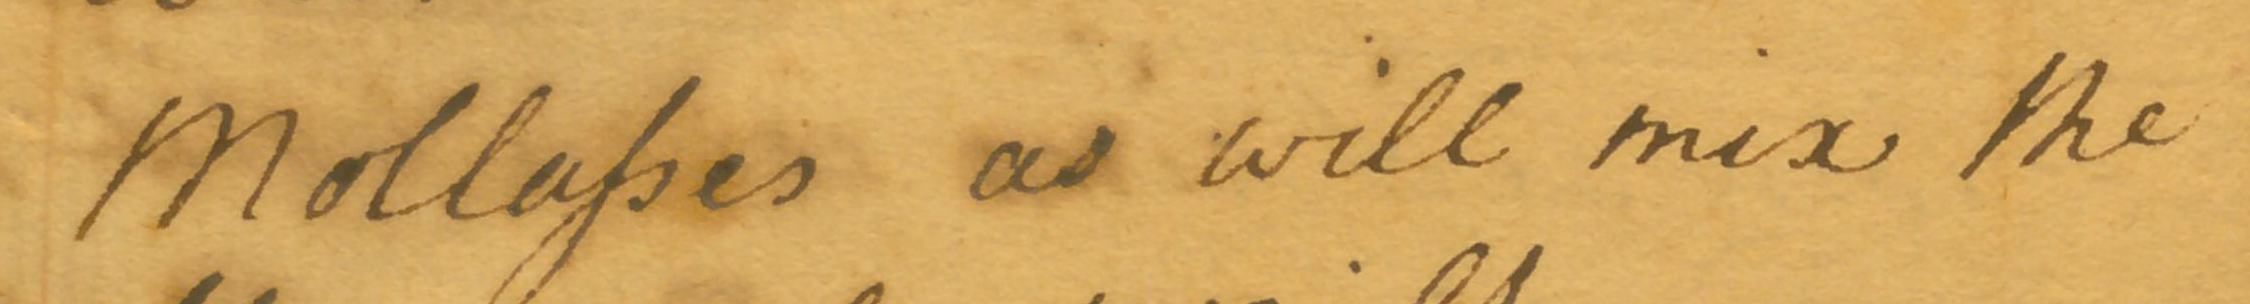Mollasses as will mix the
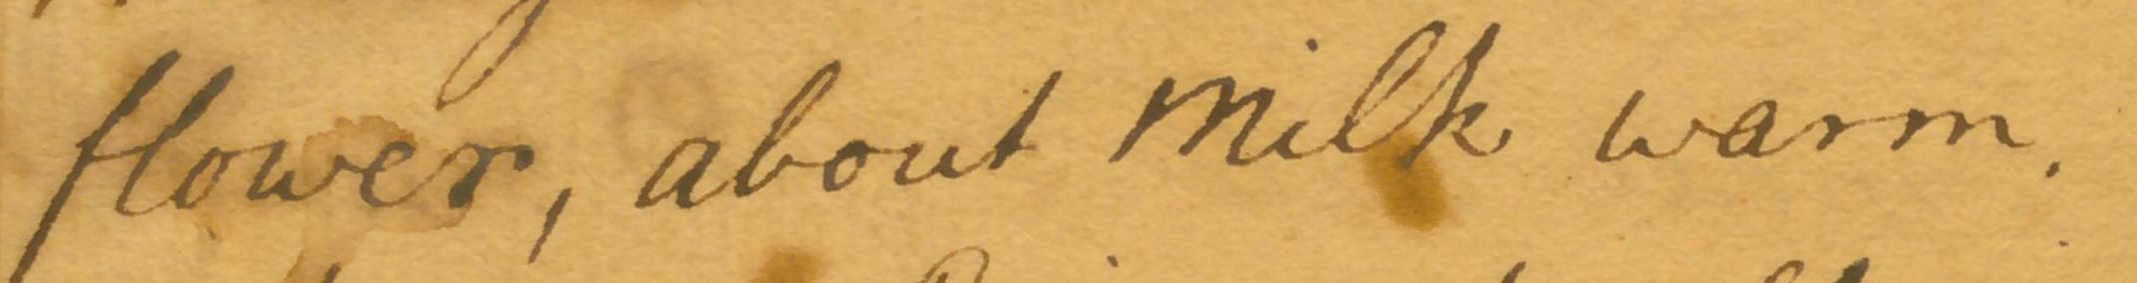flower, about milk warm.
